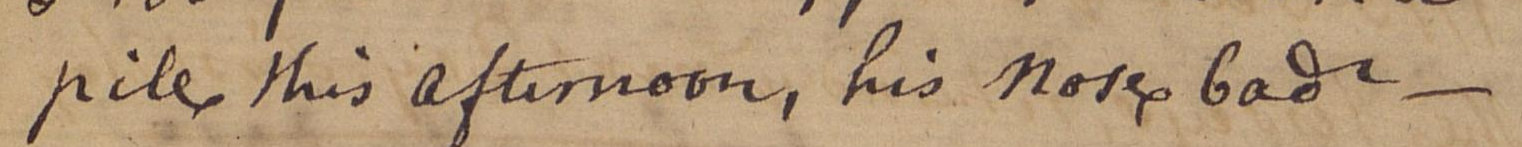pill this afternoon, his Nose bad-
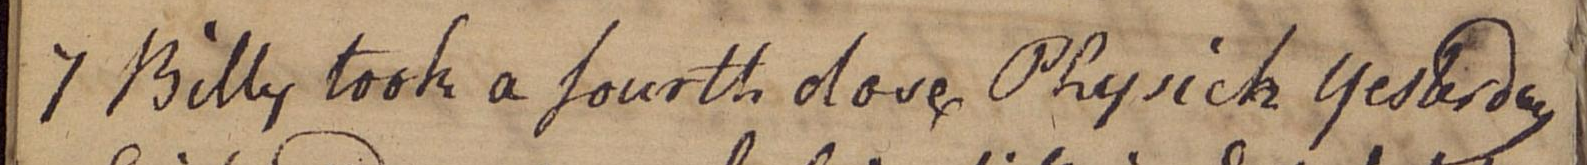7 Billy took a fourth dose Physick Yesterday
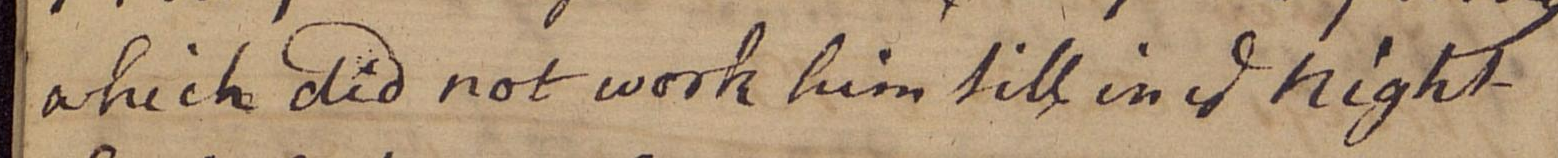which did not work him till in y^e night
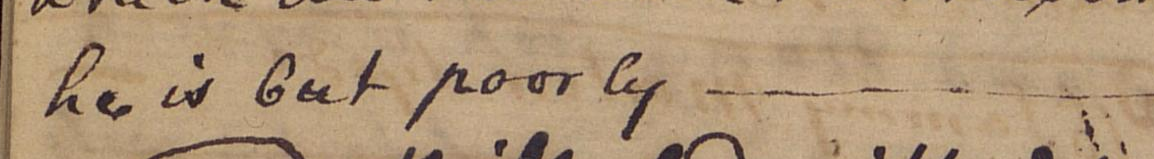he is but poorly-
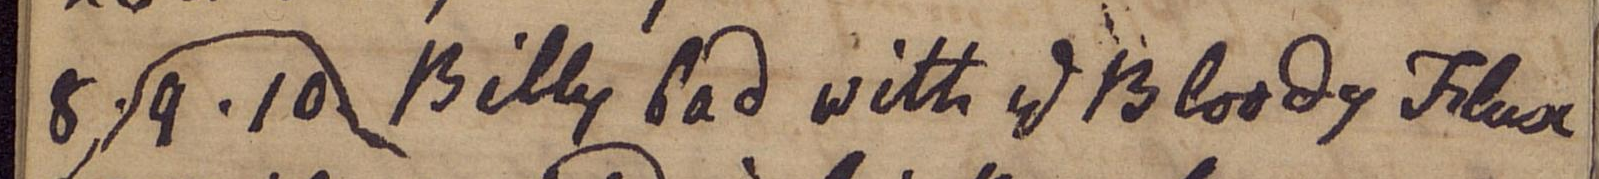8. 9. 10. Billy bad with y^e Bloody Flux
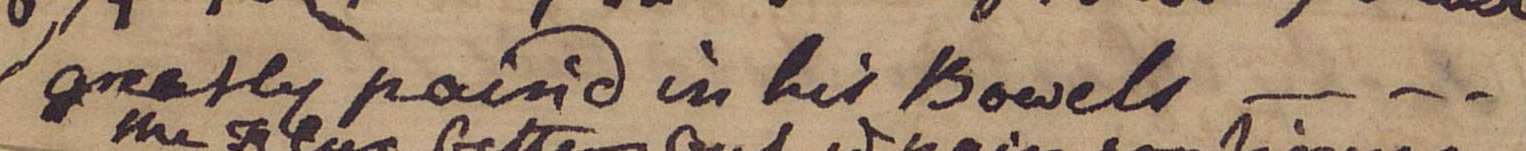greatly pain'd in his Bowels-
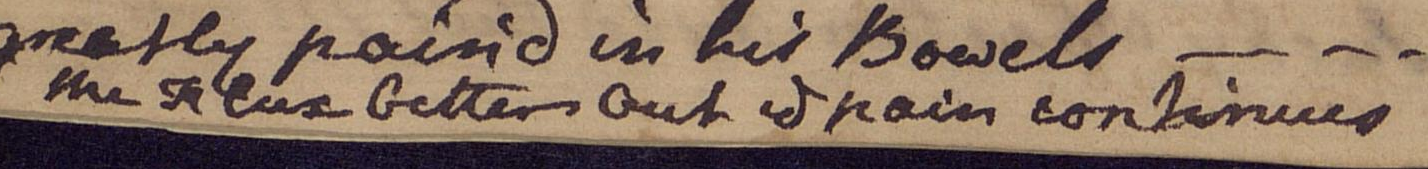the Flux better but y^e pain continues
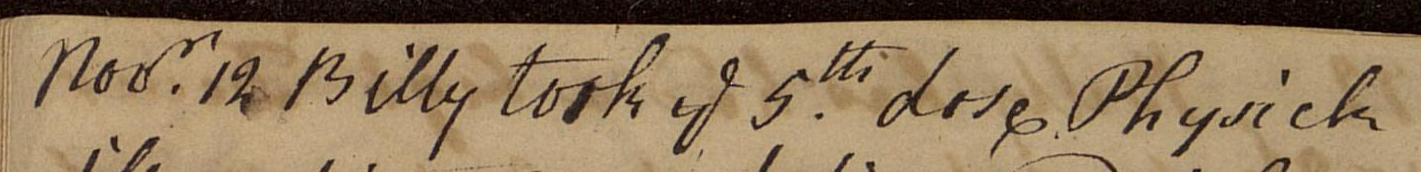Nov^r. 12 Billy took y^e 5^th. dose Physick
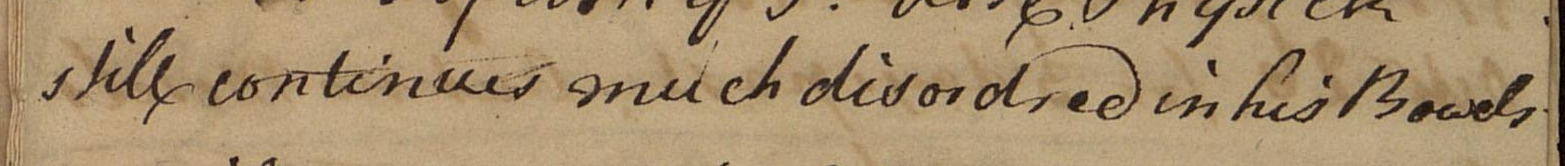still continues much disordred in his Bowels
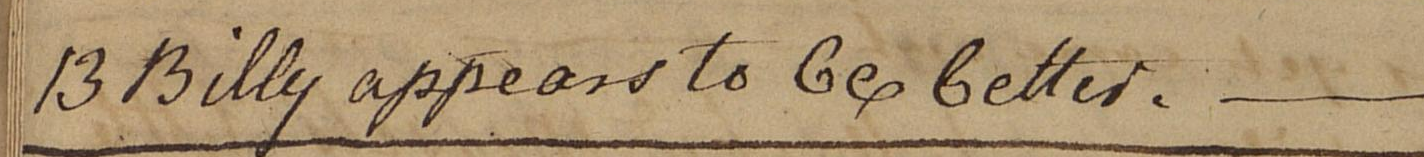13 Billy appears to be better.-
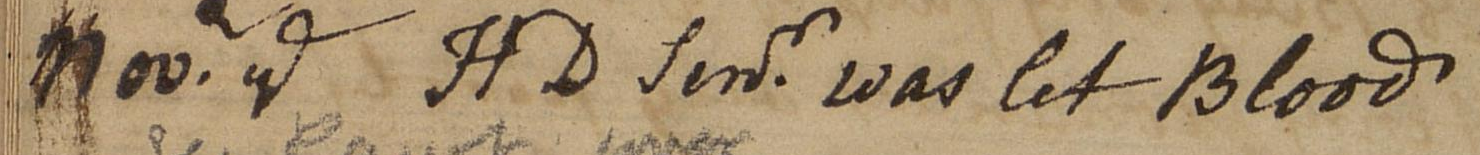Nov^r. y^e HD Sen^r. was let Blood
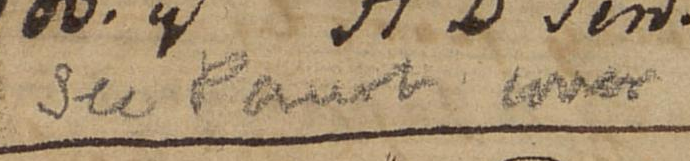see Part over
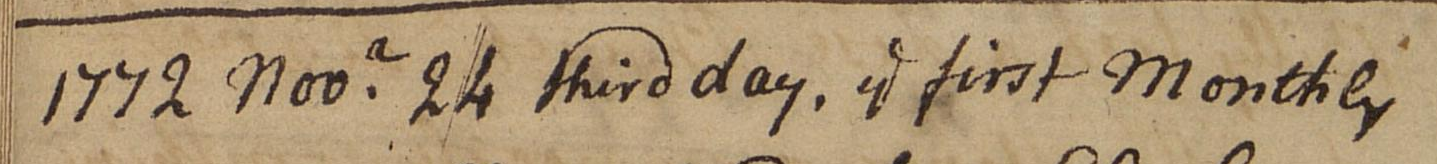1772 Nov^r. 24 third day, y^e first Monthly
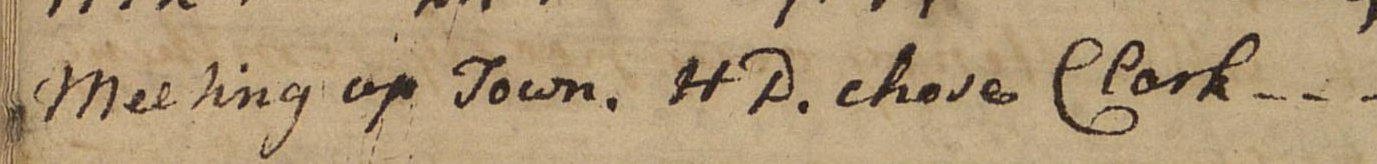Meeting up Town. HD. chose Clark-
